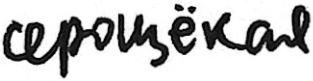серощёкая
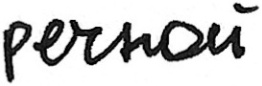речной
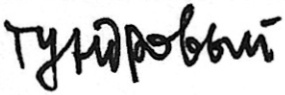тундровый
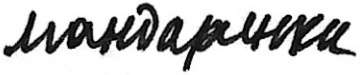мандаринки
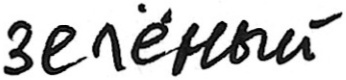зелёный
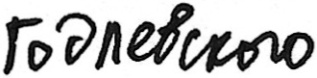годлевского
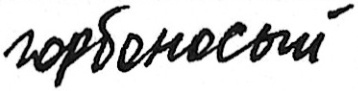горбоносый
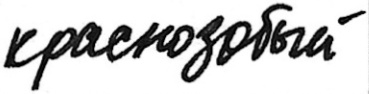краснозобый
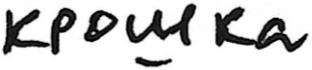крошка
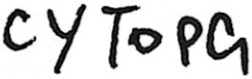сутора
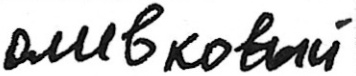оливковый
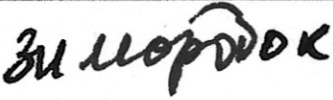зимородок
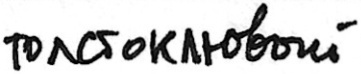толстоклювый
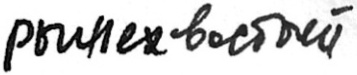рыжехвостый
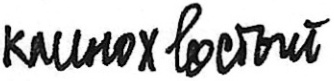клинохвостый
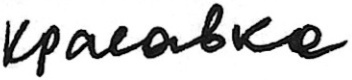красавка
